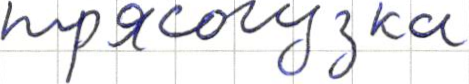трясогузка
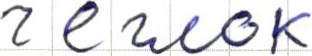чеглок
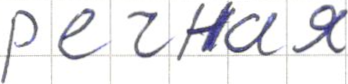речная
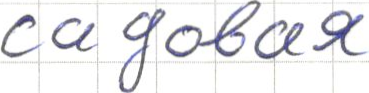садовая
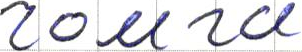чомга
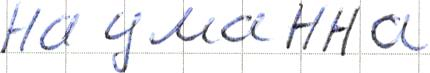науманна
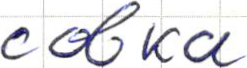совка
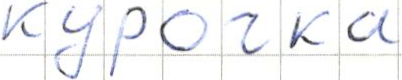курочка
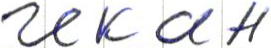чекан
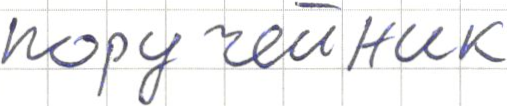поручейник
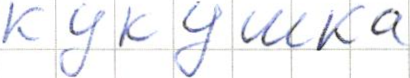кукушка
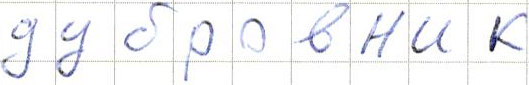дубровник
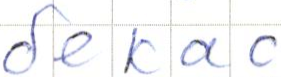бекас
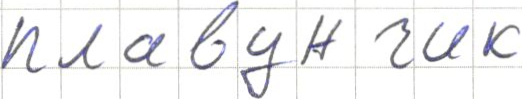плавунчик
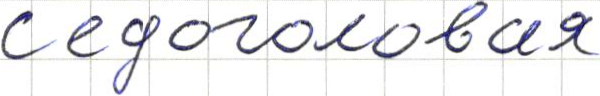седоголовая
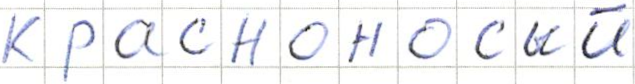красноносый
